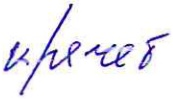кречет
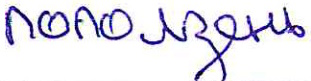поползень
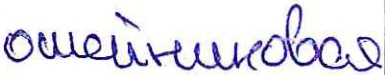ошейниковая
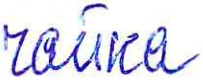чайка
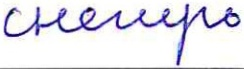снегирь
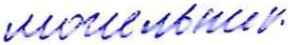могильник
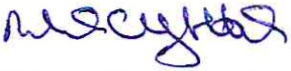плясунья
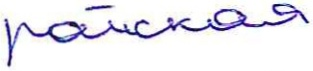райская
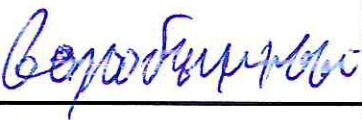воробьиный
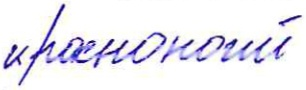красноноий
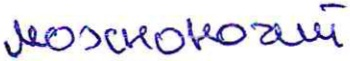мохноногий
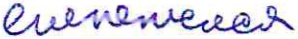египетская
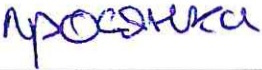просянка
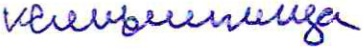камышница
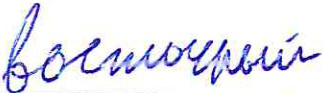восточный
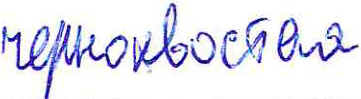чернохвостая
